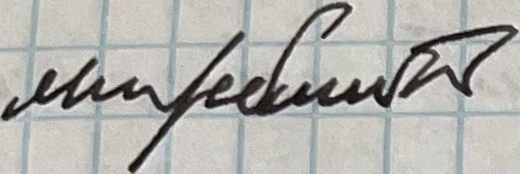ястребиный
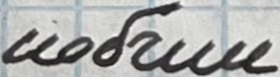кобчик
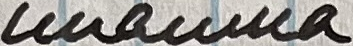ипатка
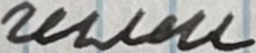чеглок
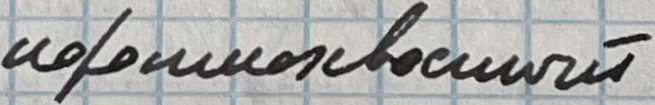короткохвостый
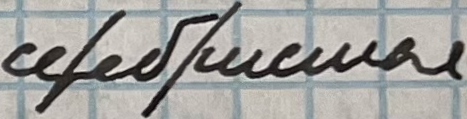серебристая
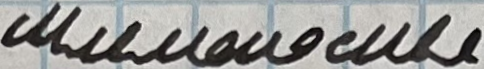шлемоносная
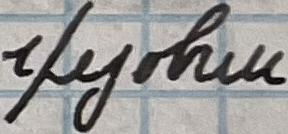грязовик
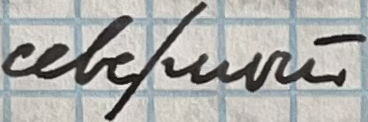северный
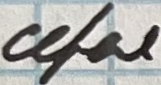серая
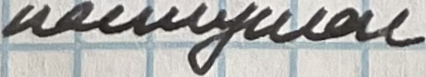пастушок
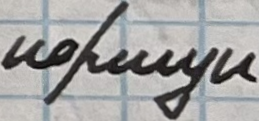коршун
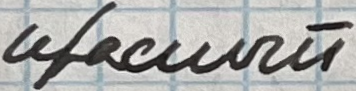красный
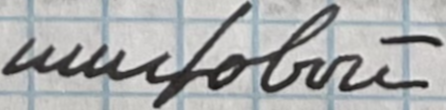тигровый
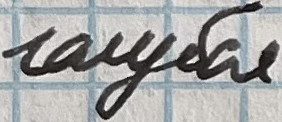голубая
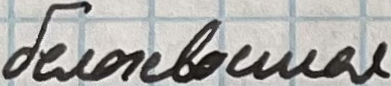белохвостая
